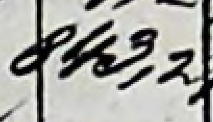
843,2
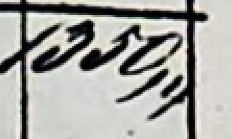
1350,4
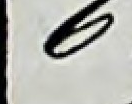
6
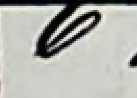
6
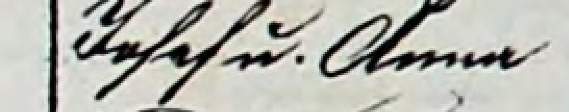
Josef u. Anna
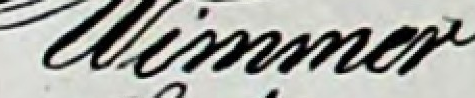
Wimmer
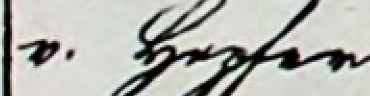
v. Hepfer
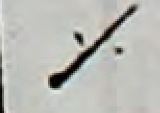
./.
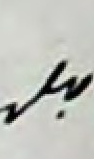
Do
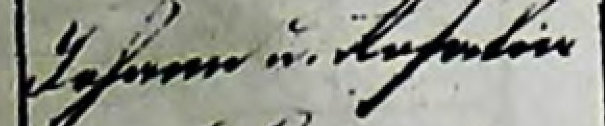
Johann u. Rosalia
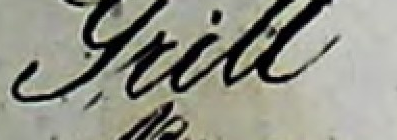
Grill
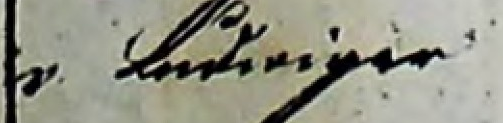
v. Ludwiger
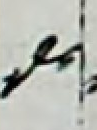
Do
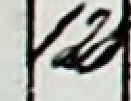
128
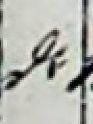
Do
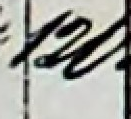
120
